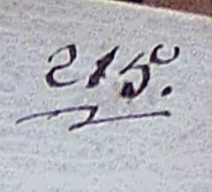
215.
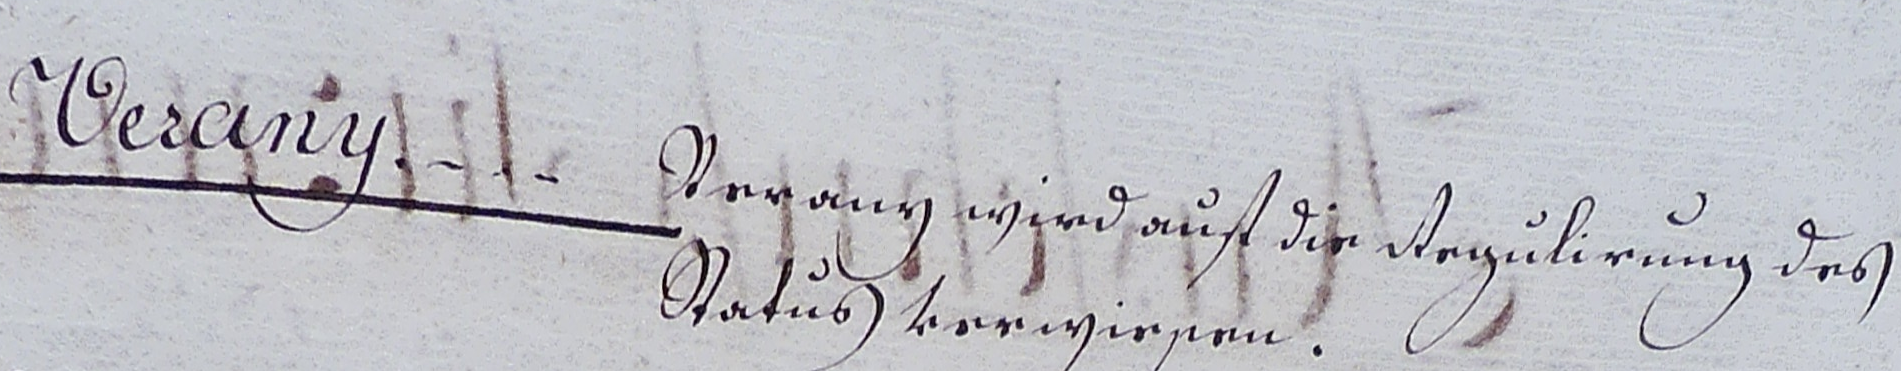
Verany. .. .. Verany, wird auf die Regulirung deb
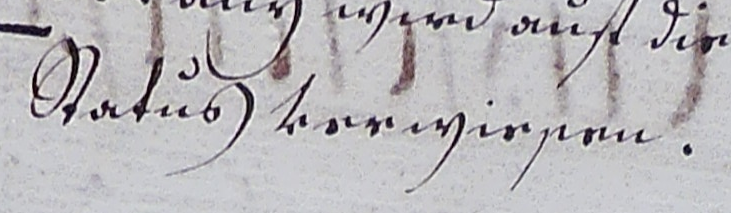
Status verwiesen.
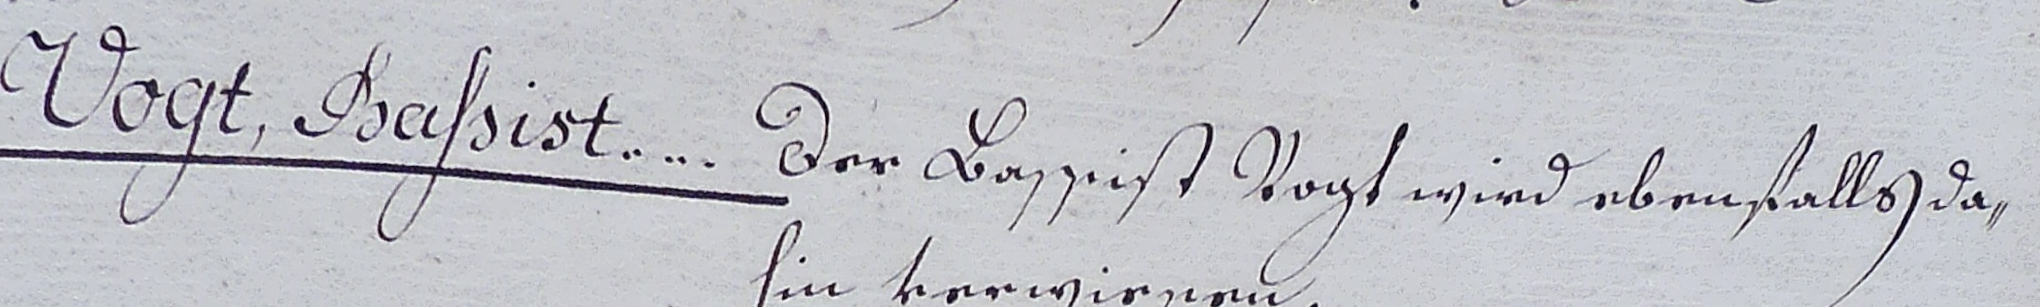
Vogt, Bassist .. .. . Der Bassist Vogt wird ebenfalls da¬
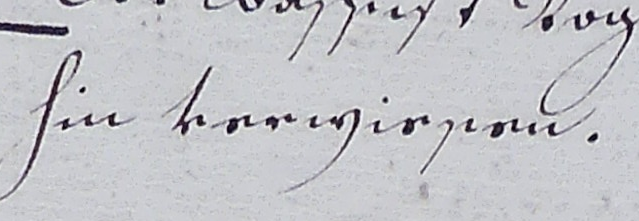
hin verwiesen.
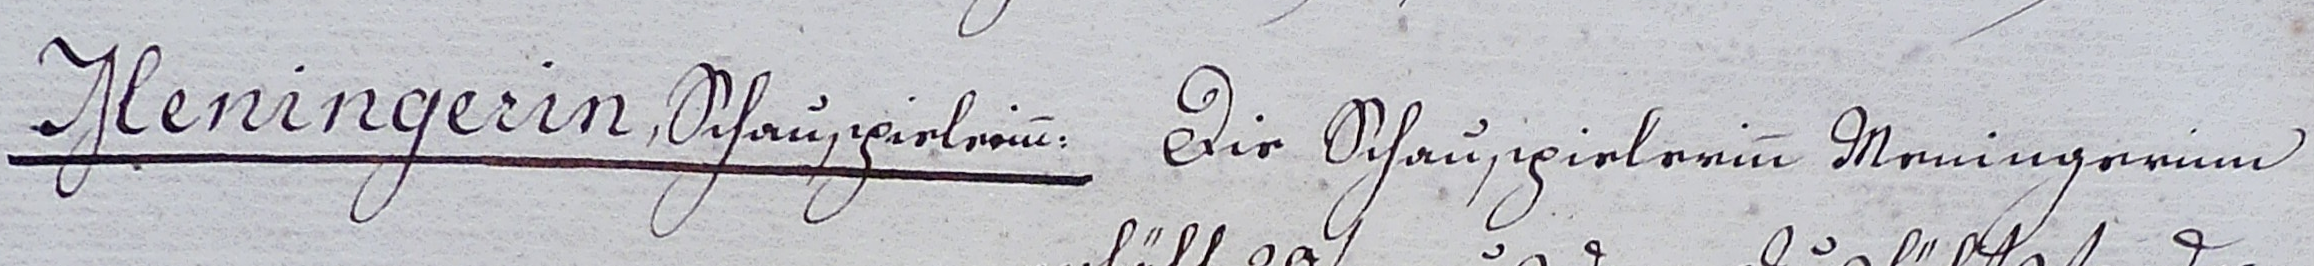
Meningerin, Schauspielerin̅: Die Schauspielerin̅ Meningerinn
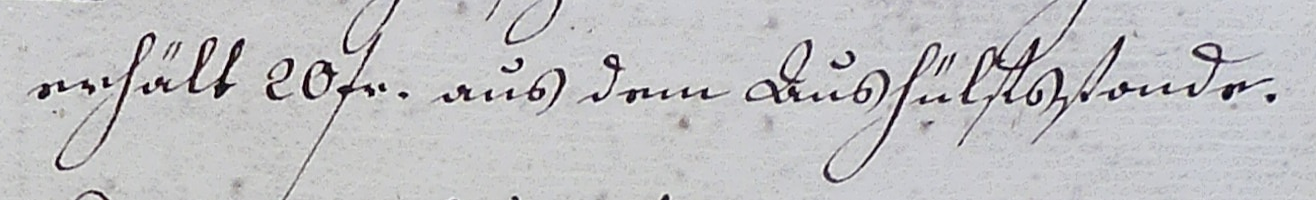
erhält 20fr. aus dem Aushülfsfonde.
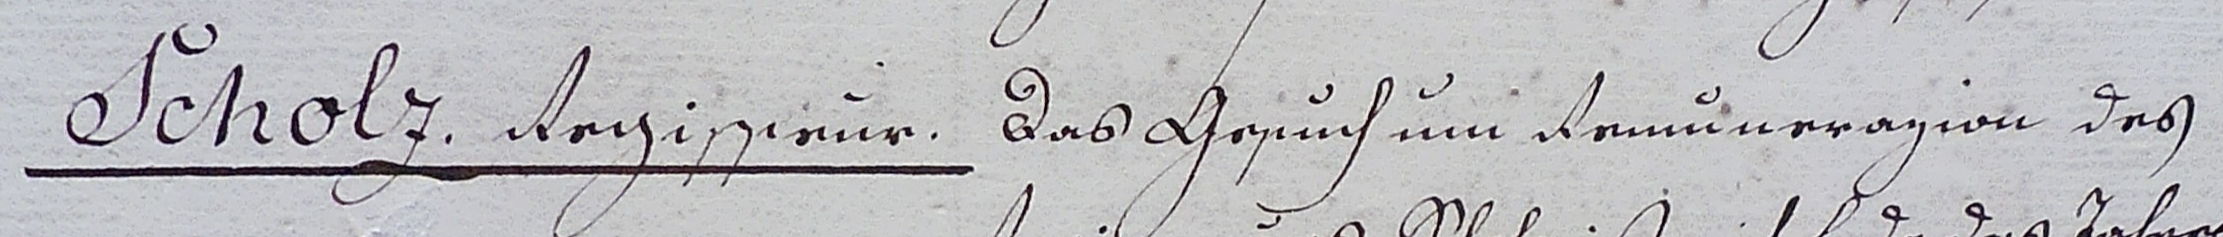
Scholz. Regisseur. Das Gesuch um Remunerazion des
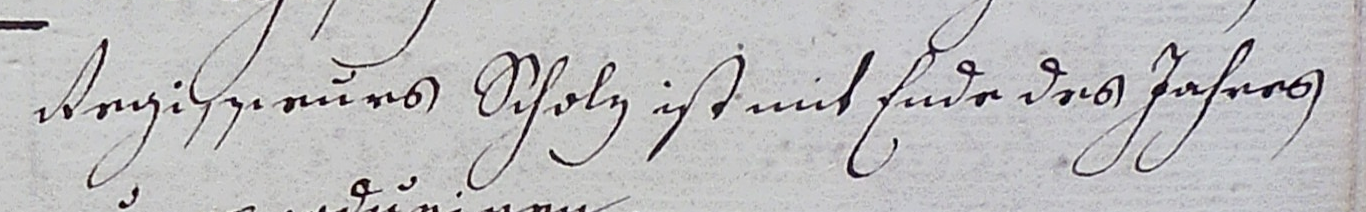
Regisseurs Scholz ist mit Ende des Jahres
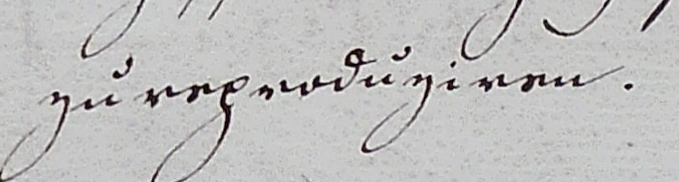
zu reproduziren.
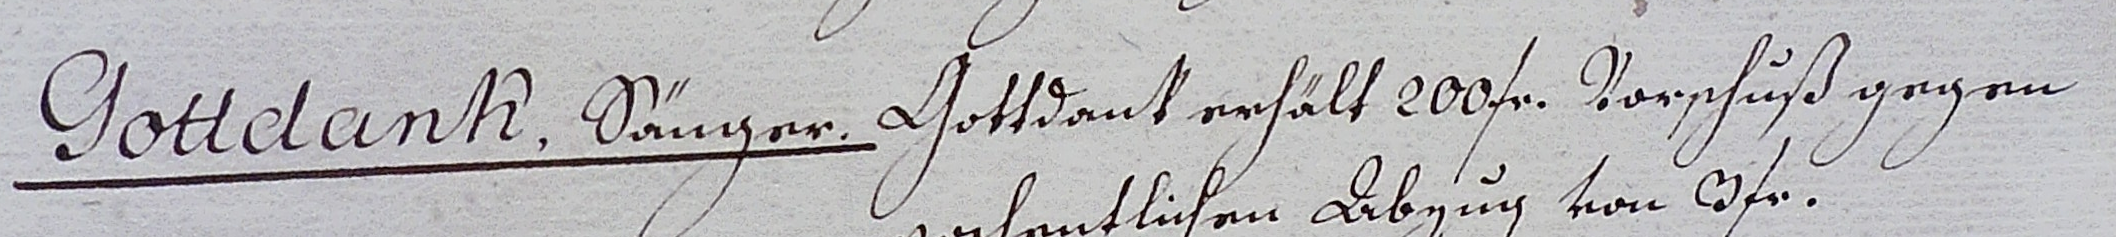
Gottdank, Sänger. Gottdank erhält 200fr. Vorschuß gegen
